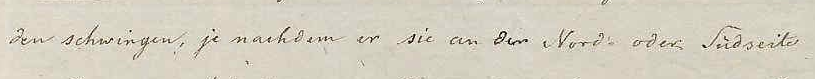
den schwingen, je nachdem er sie an den Nord- oder Südseite
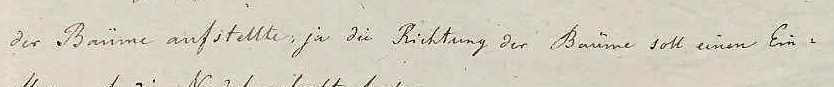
der Bäume aufstellte, ja die Richtung der Bäume soll einen Ein-
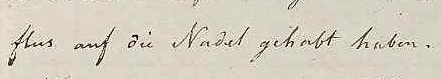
flus auf die Nadel gehabt haben.
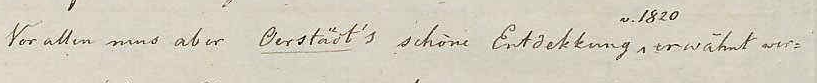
Vor allen mus aber Oerstädt's schöne Entdekkung v. 1820 erwähnt wer-
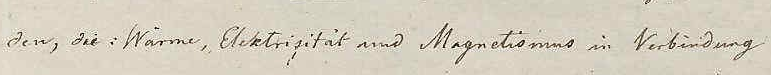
den, die: Wärme, Elektrizität und Magnetismus in Verbindung
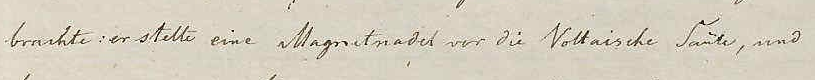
brachte: er stellte eine Magnetnadel vor die Voltaische Säule, und
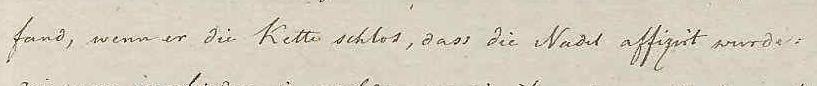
fand, wenn er die Kette schlos, dass die Nadel affizirt wurde:
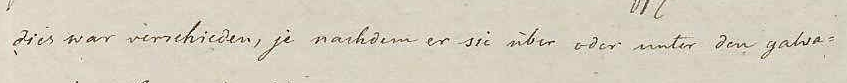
dies war verschieden, je nachdem er sie über oder unter den galva-
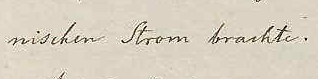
nischen Strom brachte.
